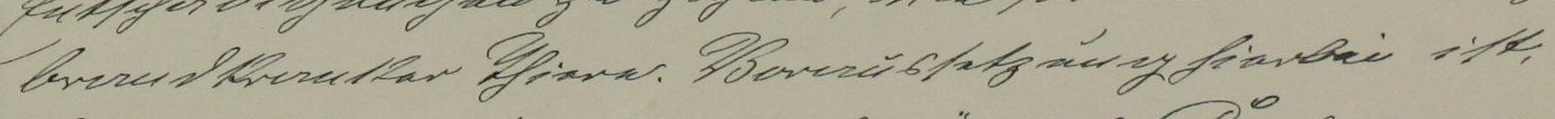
brandkranker Thiere. Voraussetzung hierbei ist,
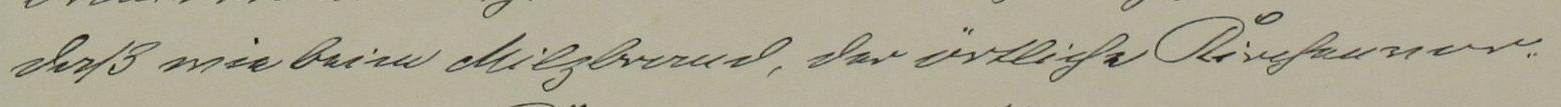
daß wie beim Milzbrand, der örtliche Kirchenvor-
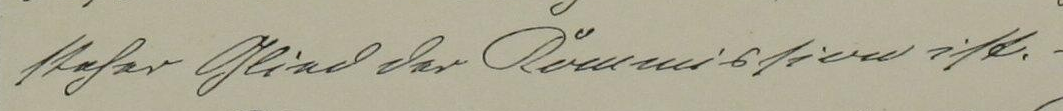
steher Glied der Kommission ist.
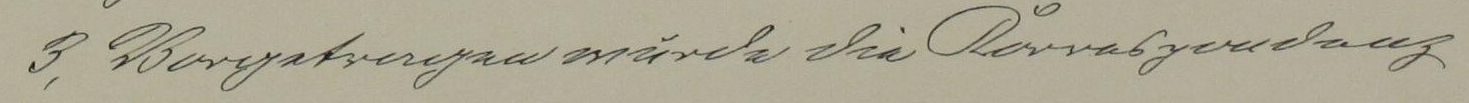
3. Vorgetragen wurde die Korrespondenz
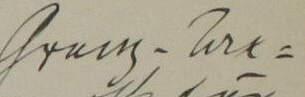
Grenz-Tax-
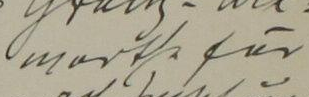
werte für
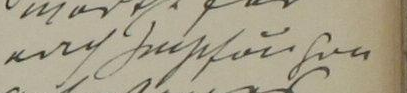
nach Impfungen
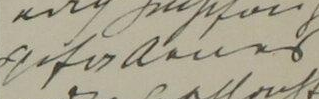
gefallenes
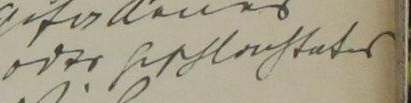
oder geschlachtetes
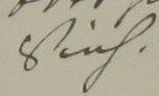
Vieh
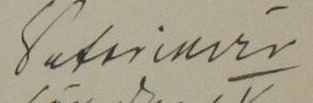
Veterinär
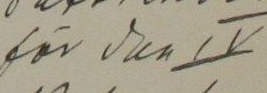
für den IV
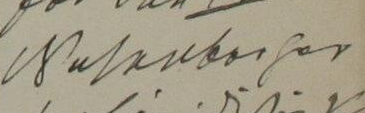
Wesenberger
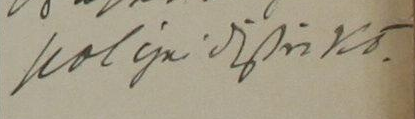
Polizeidistrikt.
